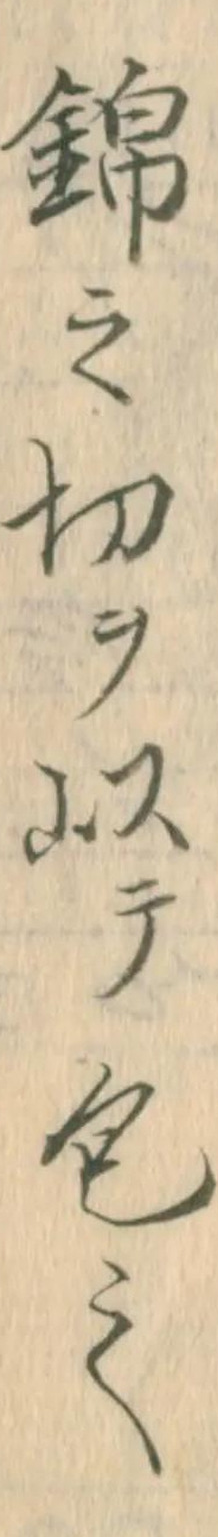錦之切ヲ以テ包之
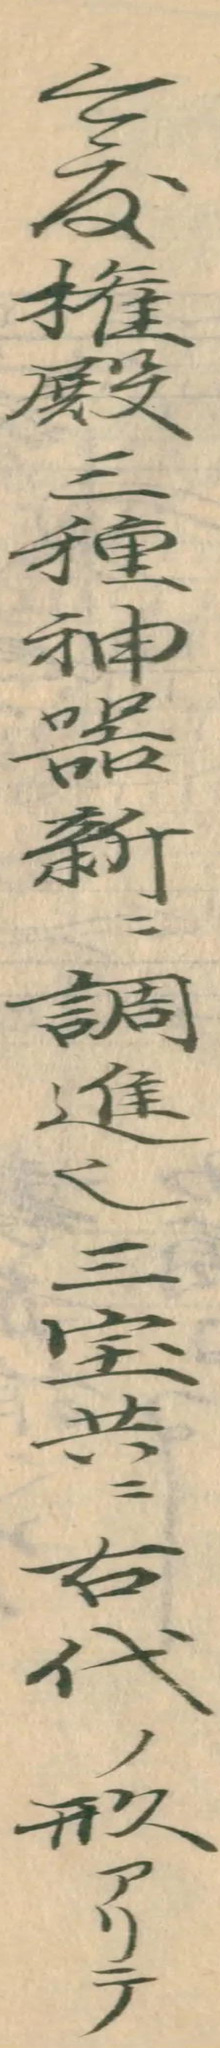一今度権殿三種神器新ニ調進也三宝共ニ古代ノ形アリテ
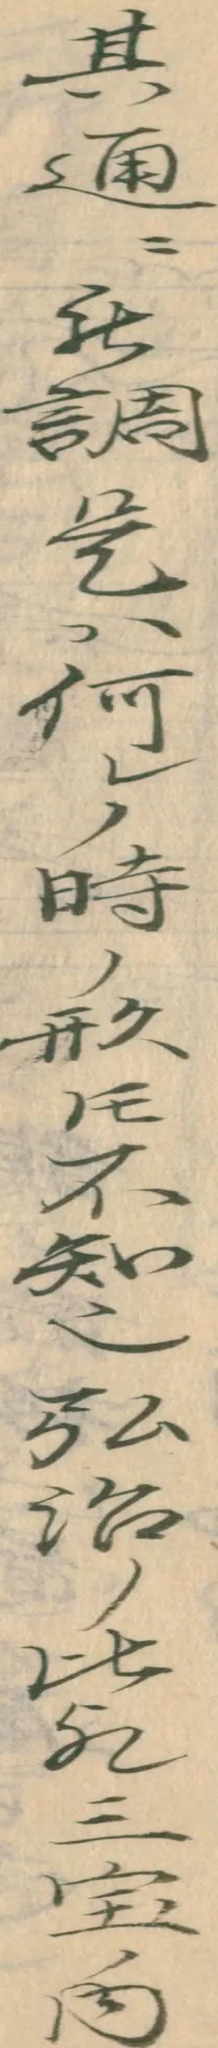其通ニ被調是ハ何レノ時ノ形トモ不知也弘治ノ頃歟三宝ノ内
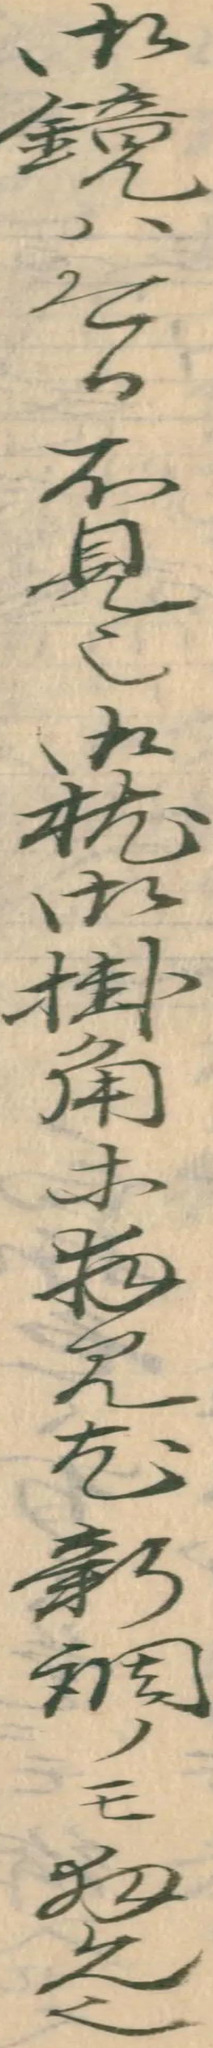御鏡ハ今日不見也御枕御掛角等拝見尤新調ノモ拝見也
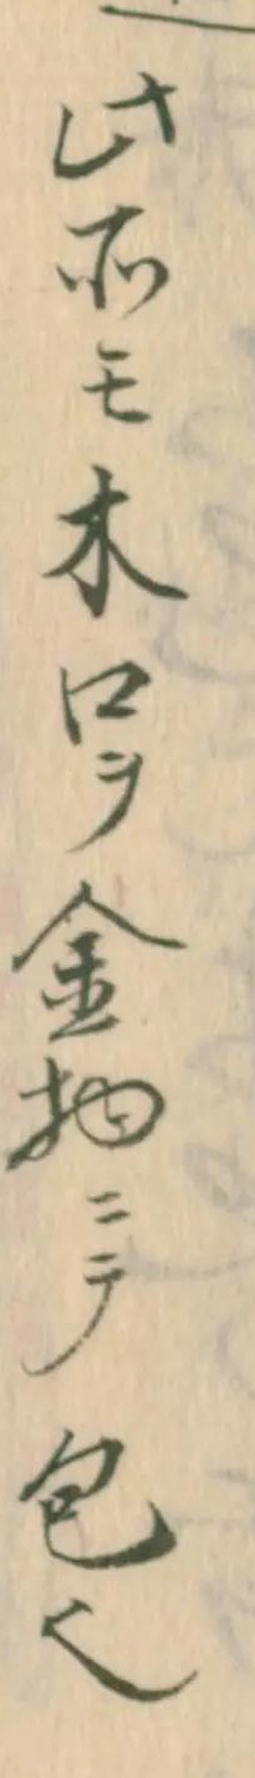此所モ木口ヲ金物ニテ包也
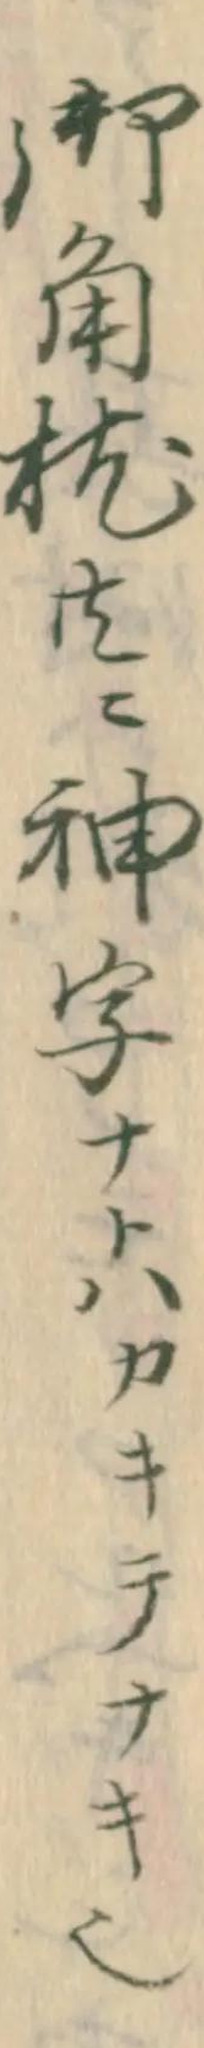御角枕共ニ神字ナトハカキテナキ也
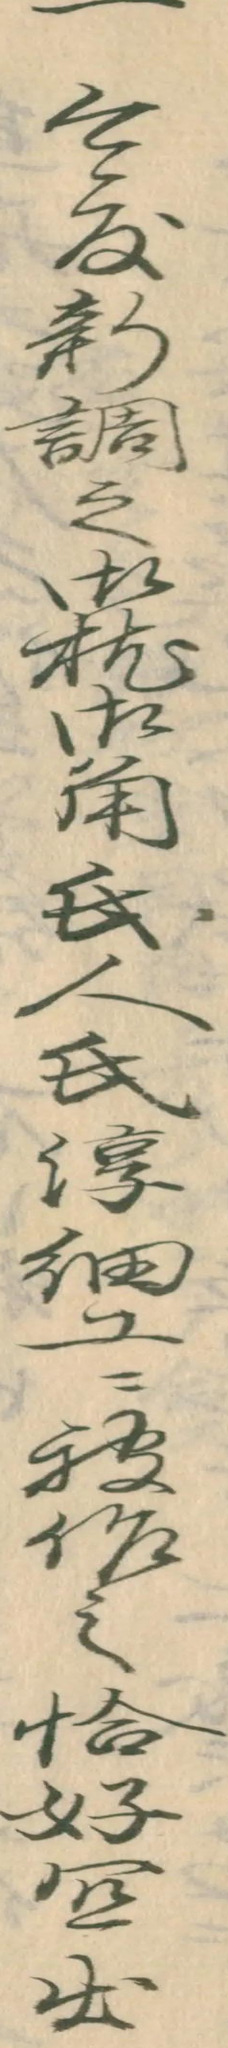一今度新調之御枕御角氏人氏淳細工ニ被作之恰好宜出
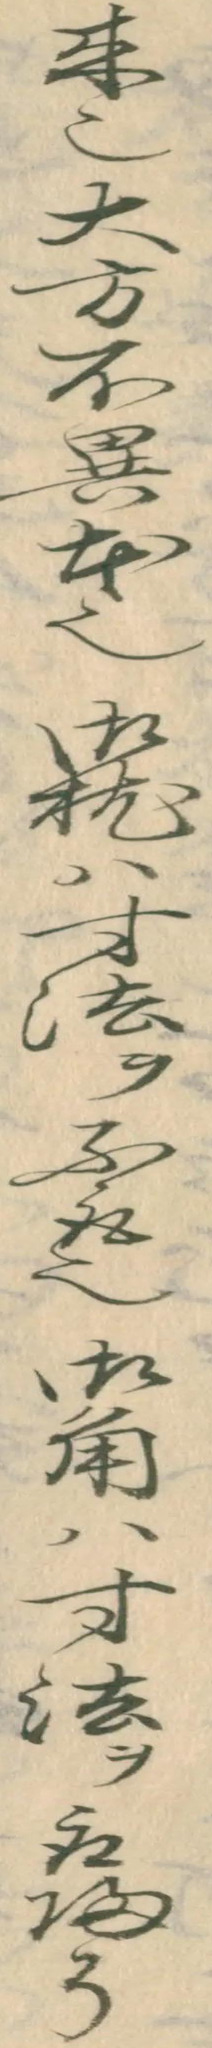来也大方不異本也御枕ハ寸法ヲ不取也御角ハ寸法ヲ取帰了

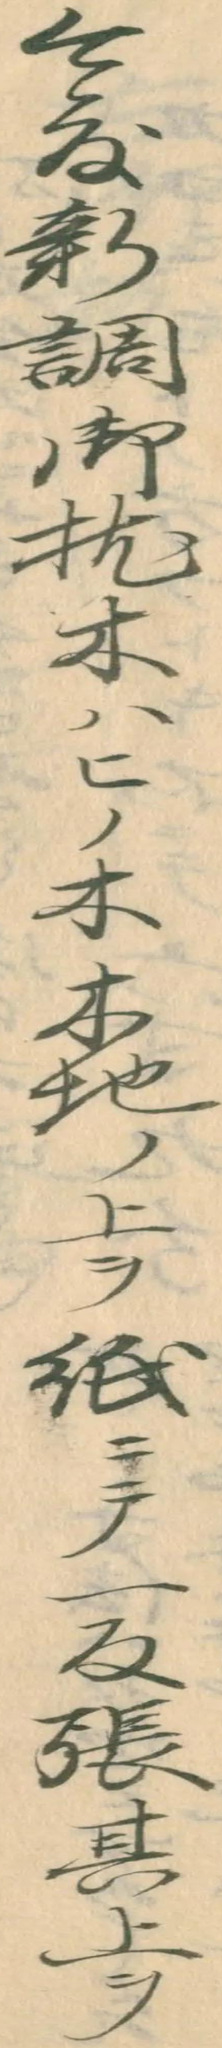今度新調御枕木ハヒノ木木地ノ上ヲ紙ニテ一反張其上ヲ
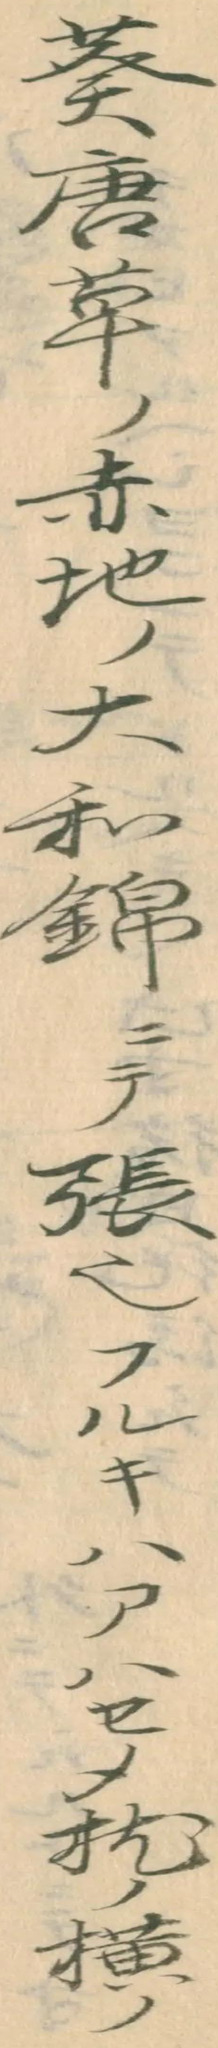葵唐草ノ赤地ノ大和錦ニテ張也フルキハアハセシテ枕ノ横ノ
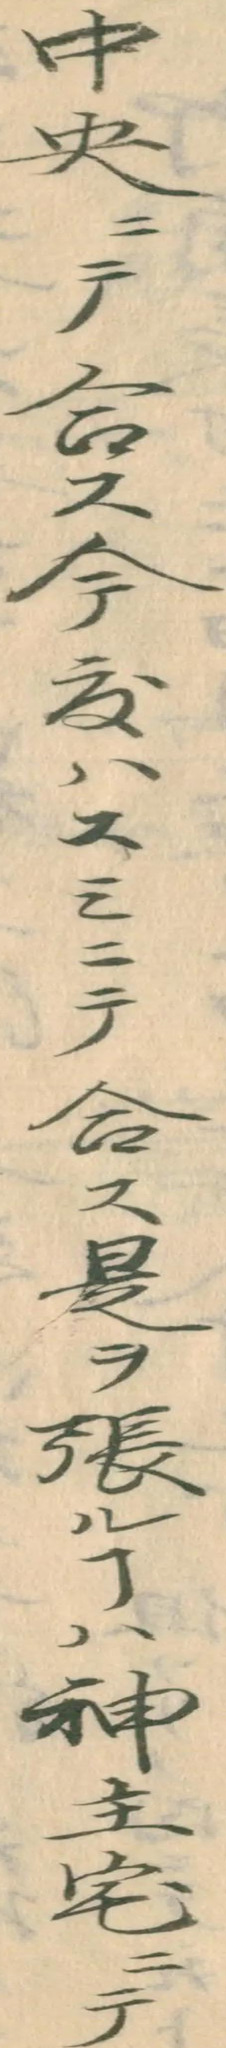中央ニテ合ス今度ハスミニテ合ス是ヲ張ルコトハ神主宅ニテ
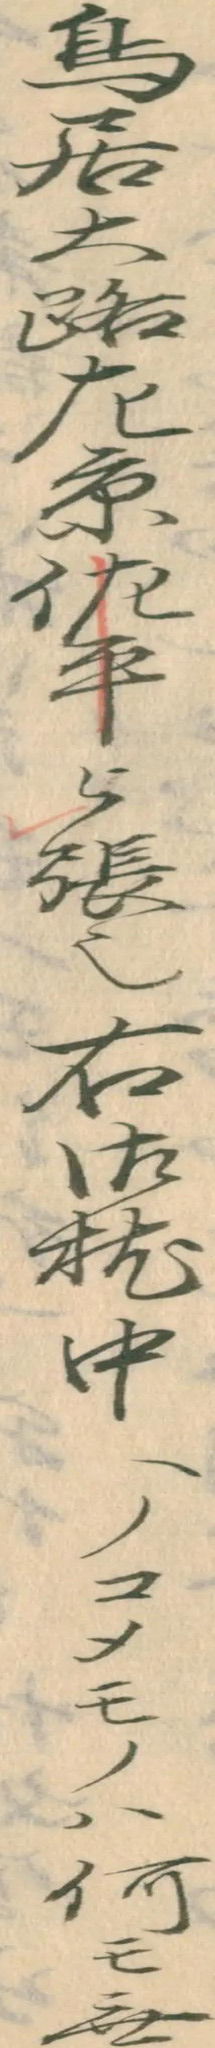鳥居大路左京佐平被張也右御枕中へノコメモノハ何モ無
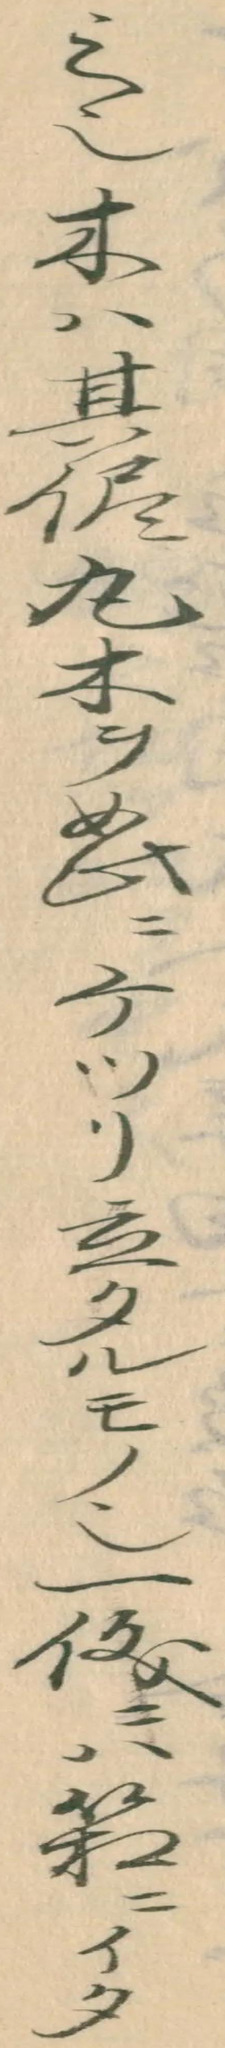之也木ハ其侭丸木ヲ如此ニケツリ立タルモノ也一儀ニハ箱ニイタ
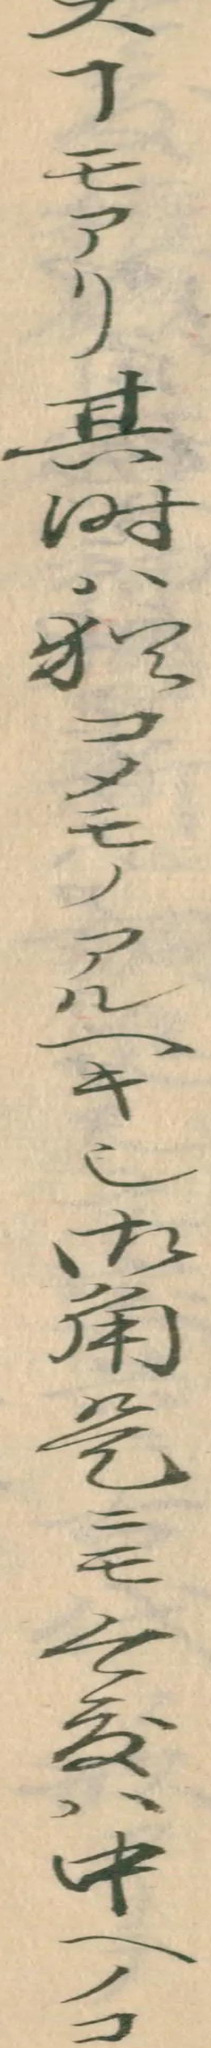スコトモアリ其時ハ猶コメモノアルヘキ也御角是ニモ今度ハ中ヘノコ
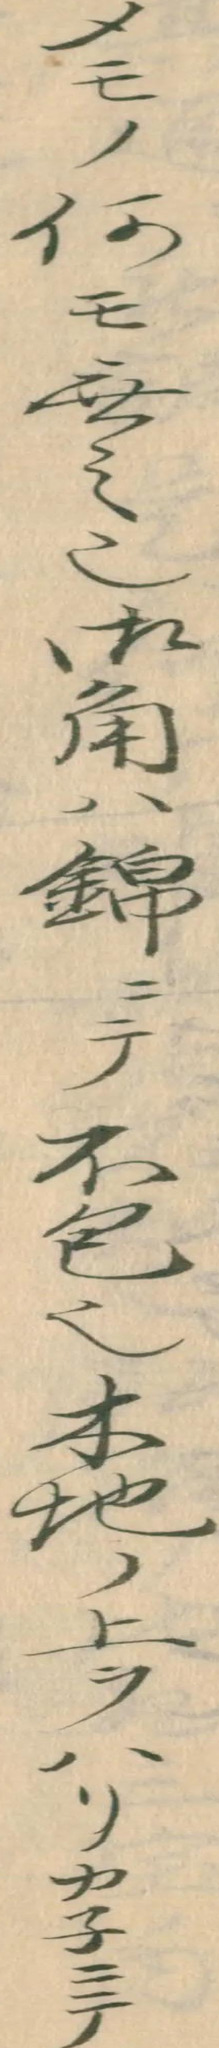メモノ何モ無之也御角ハ錦ニテ不包也木地ノ上ヲハリカネニテ
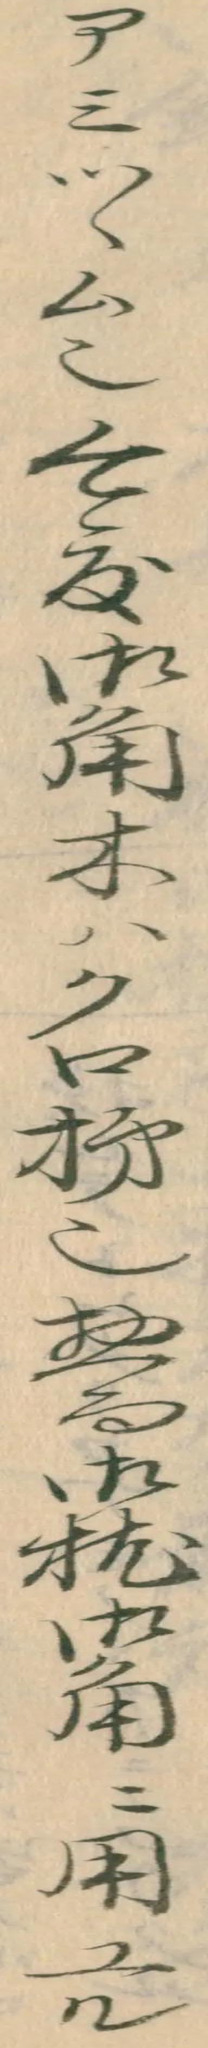アミツヽム也今度御角木ハクロ柿也惣而御枕御角ニ用ユル
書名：賀茂社記録. 第15冊
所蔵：国立国会図書館 National Diet Library, JAPAN
